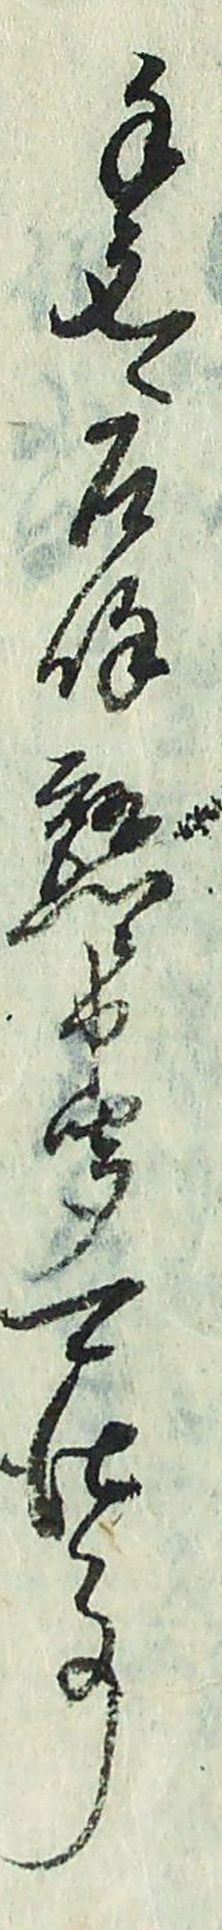手元へ召呼懇ニ申聞可仕事
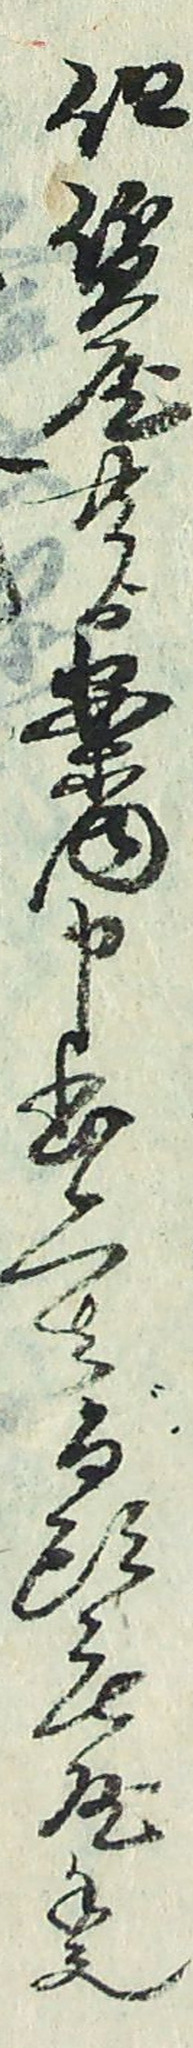但質屋共ゟ案内申出候へ者与頭庄屋手元
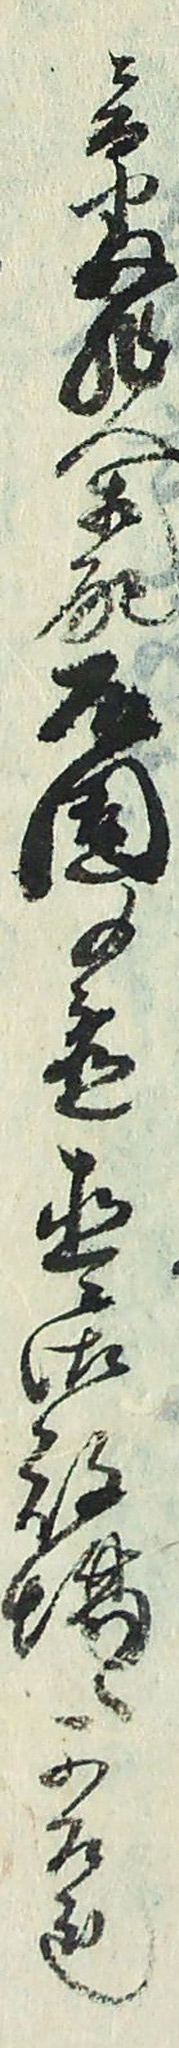ニ而番非人相配取固メ置直ニ御役場へ可召連
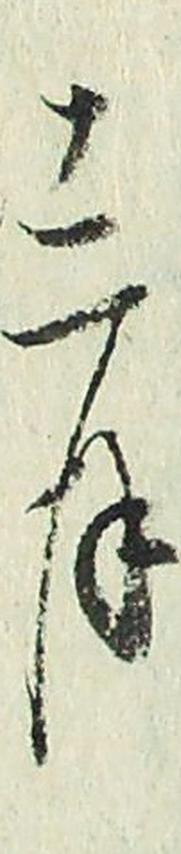十二月
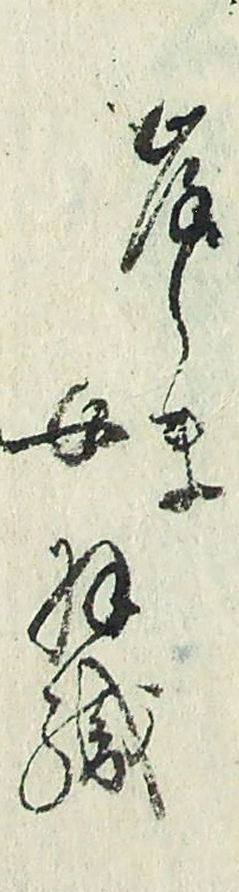女羽織

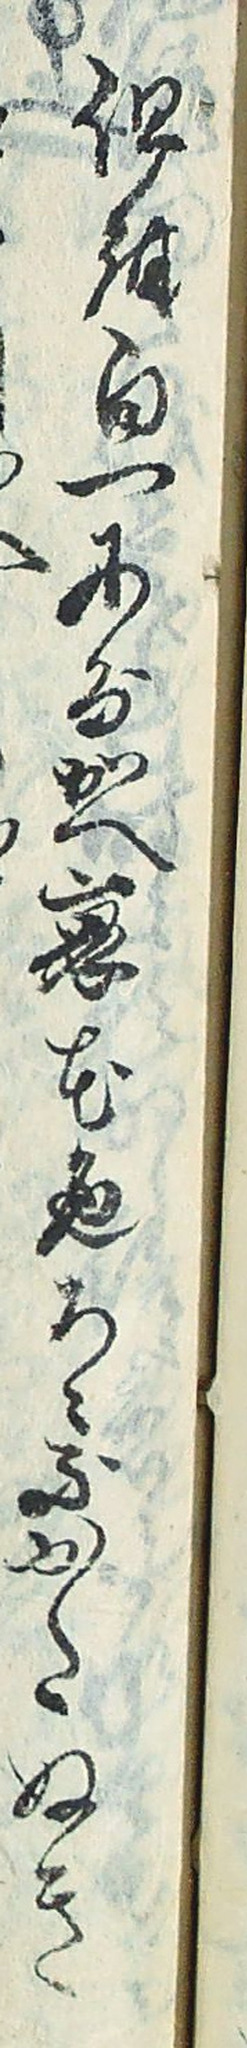但紺白一に留かへ裏花色ちニふかたぬき
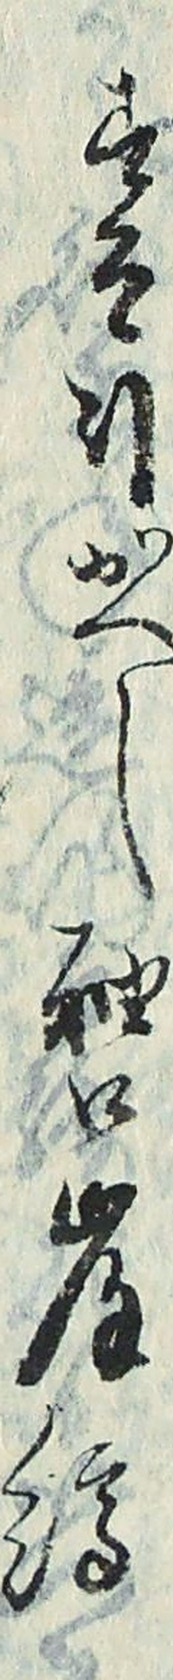すそ引かへし袖口岸縞
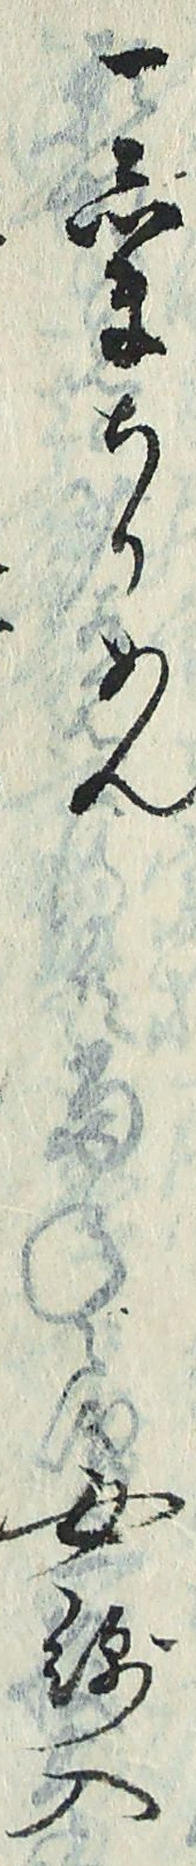一しまちりめん女綿入
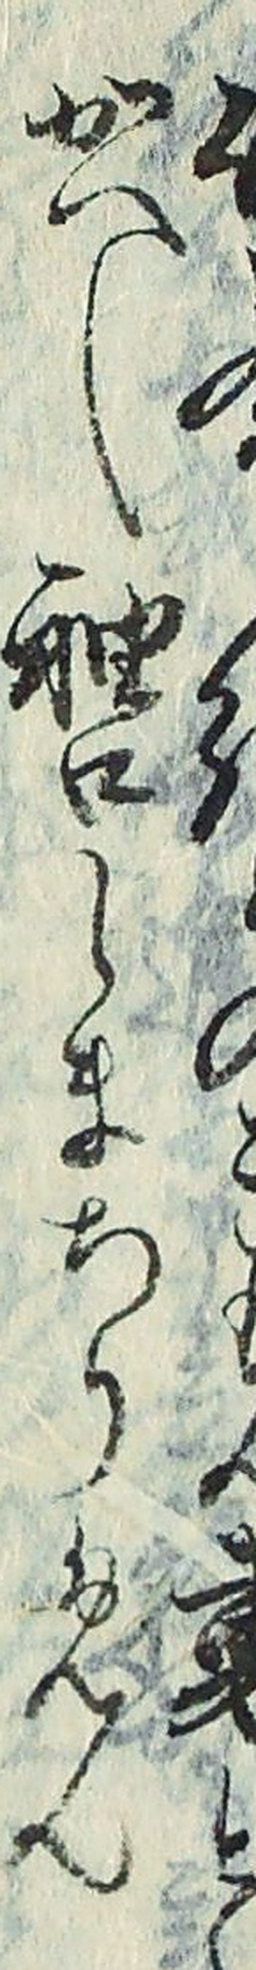かへし袖口しまちりめん
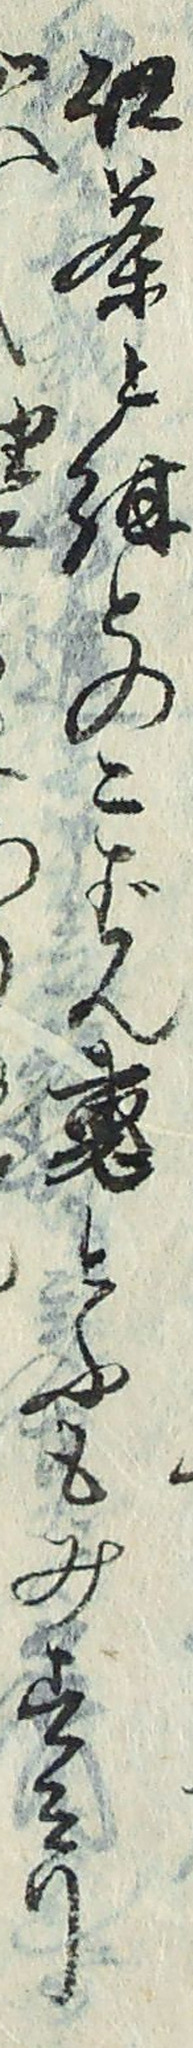但茶と紺とのこばん裏とふもみすそ引
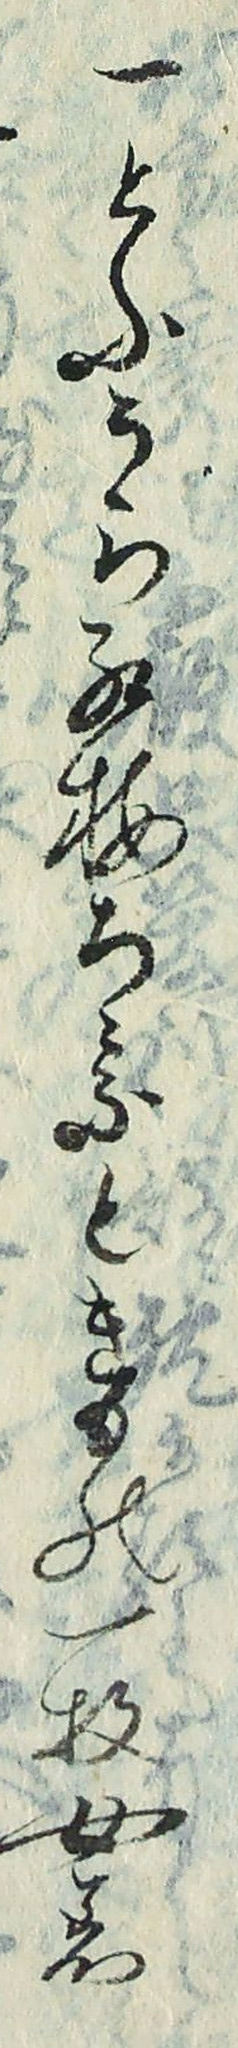一とふうら紅梅ちニふときもの一枚女着
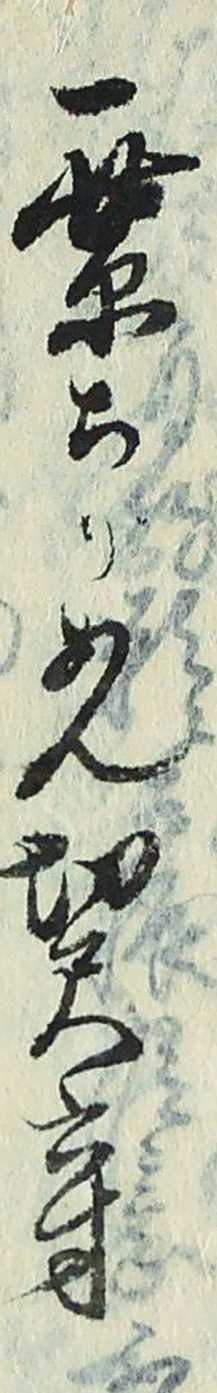一帯ちりめん切尺六寸
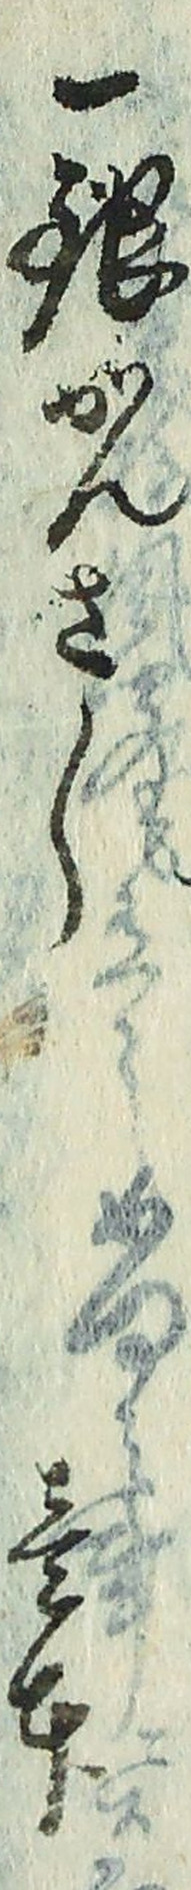一銀かんさし壱本
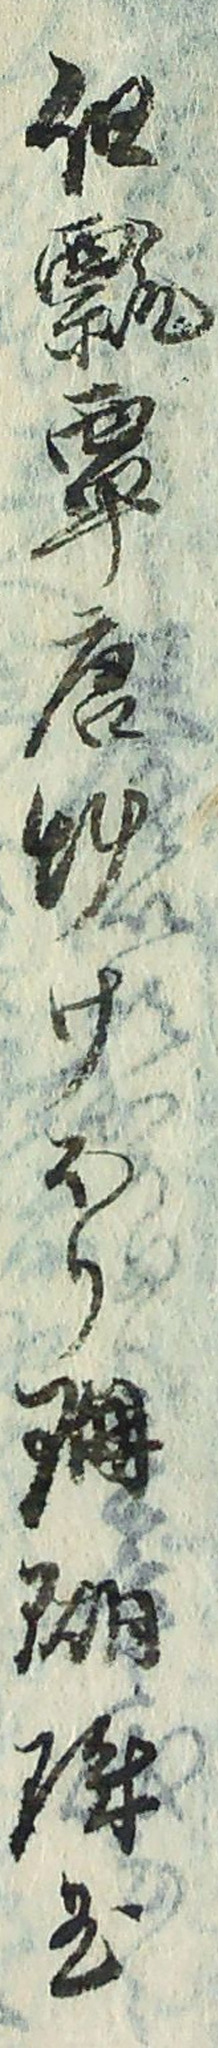但瓢箪唐艸けほり珊瑚珠玉
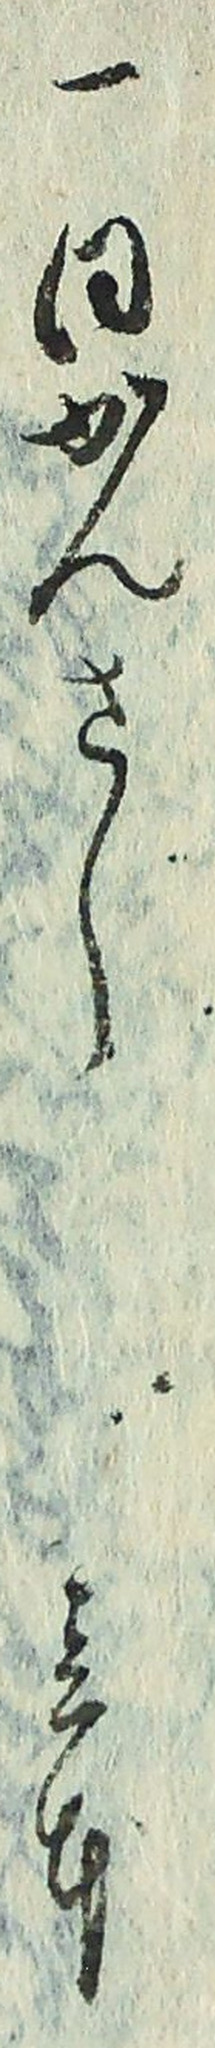一同かんさし壱本
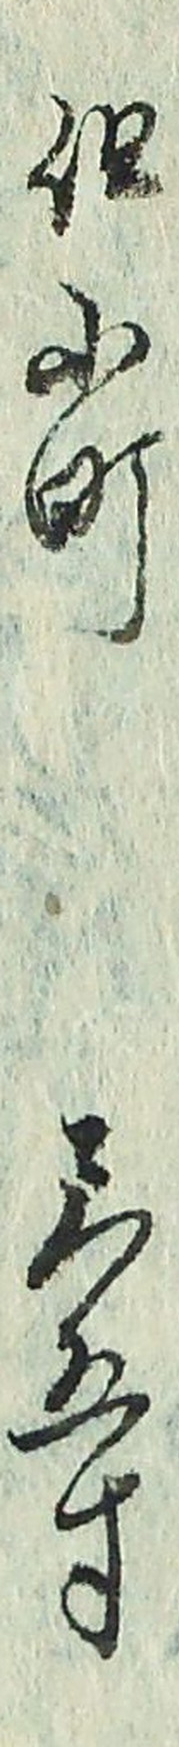但小町尺五寸
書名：諸御趣意書并御下知向之写
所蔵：鳴門教育大学 Naruto University of Education
